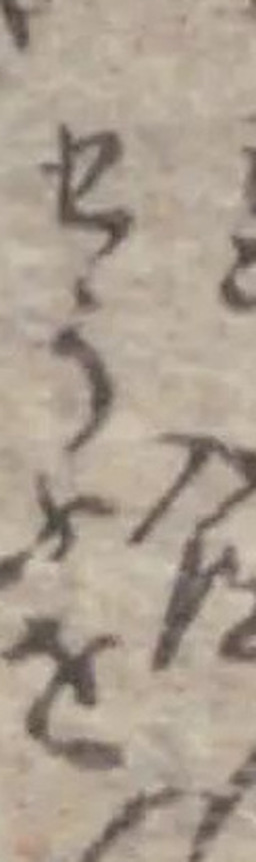せうふを
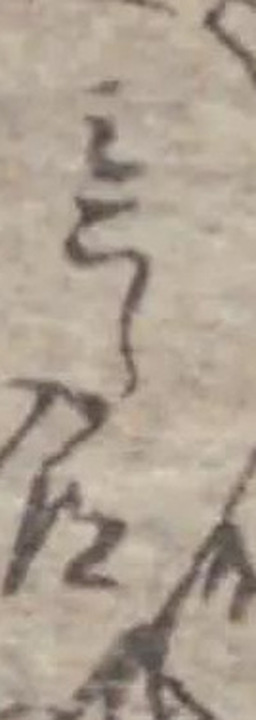みこし入道
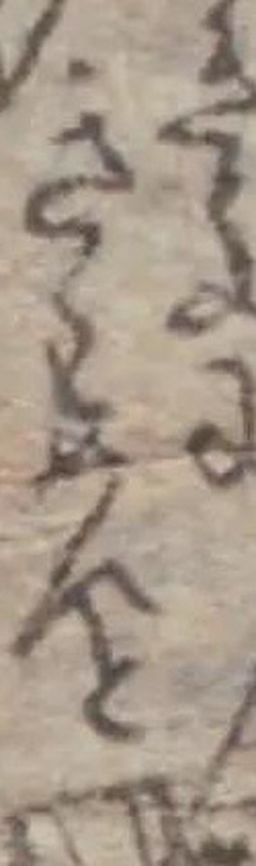きわめんと
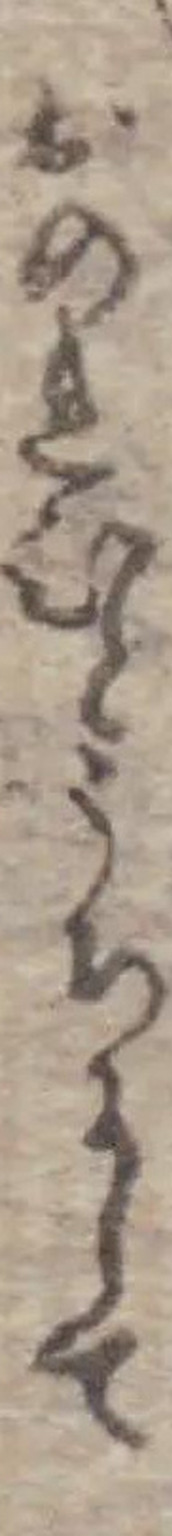おのれむこうちにして
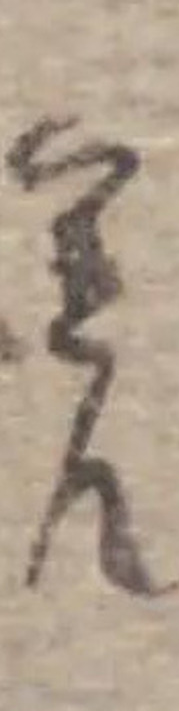くれん
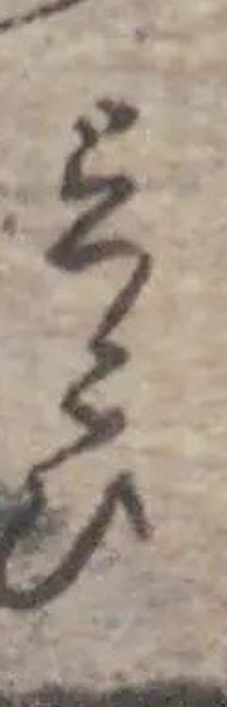とつこひ
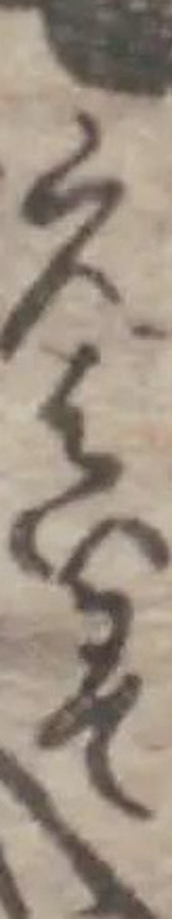くんはいにて
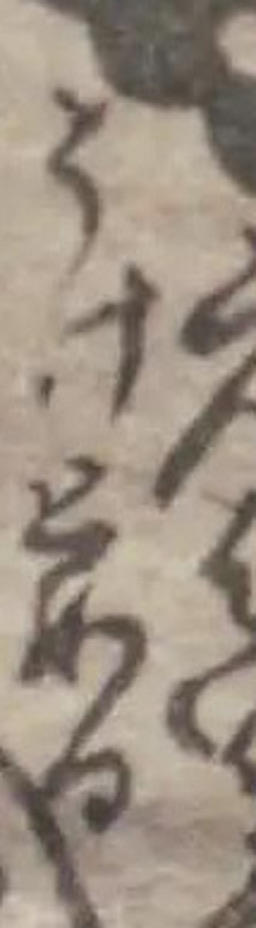うけとめる
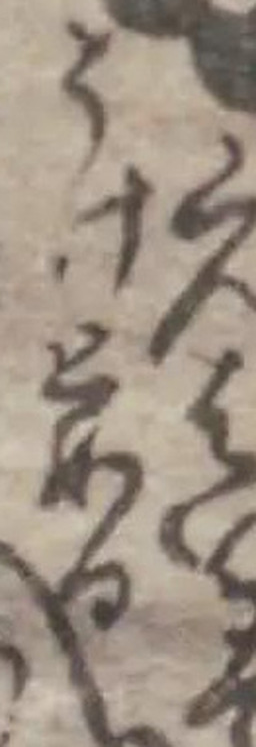うけとめる
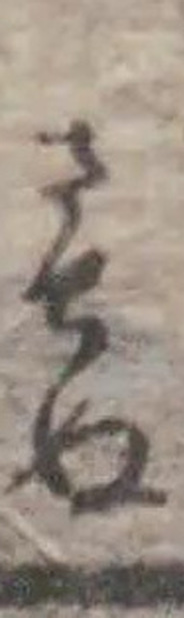させぬ
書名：化物三ツ目大ほうい 2巻
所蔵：国立国会図書館 National Diet Library, JAPAN
